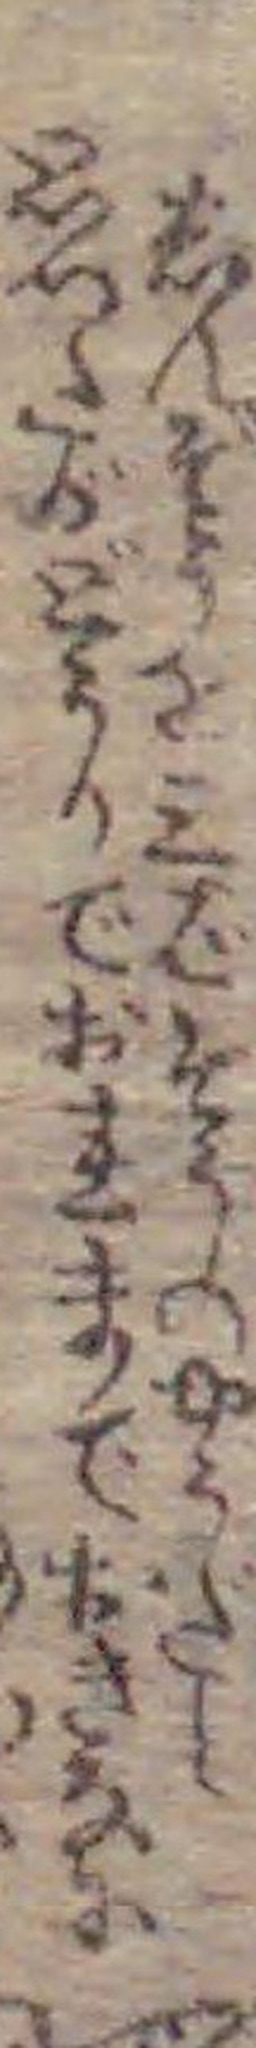思つたがどうりでおれまでおきなに

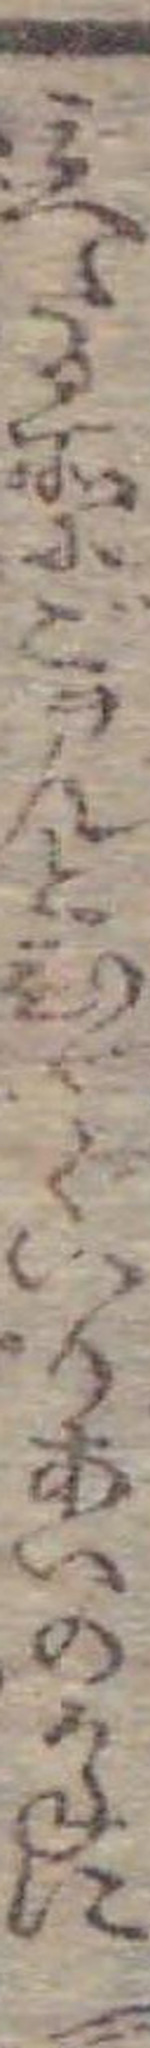みへたる所にごヲんとひゞくいりあいのかねに
